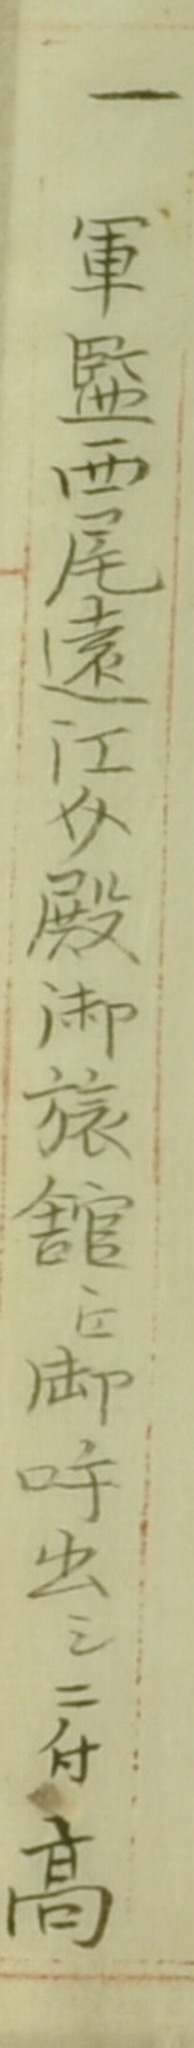一軍監西尾遠江介殿御旅館江御呼出シニ付高
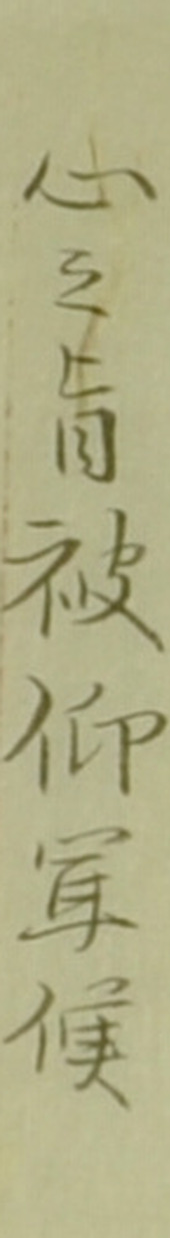心之旨被仰聞候

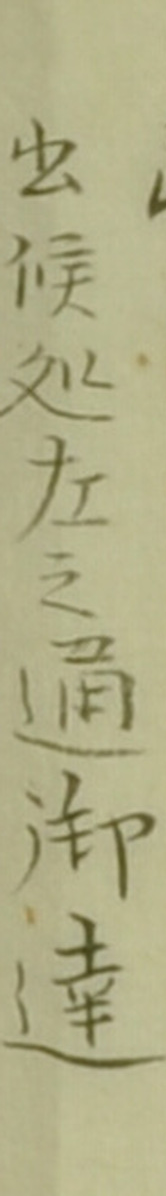出候処左之通御達
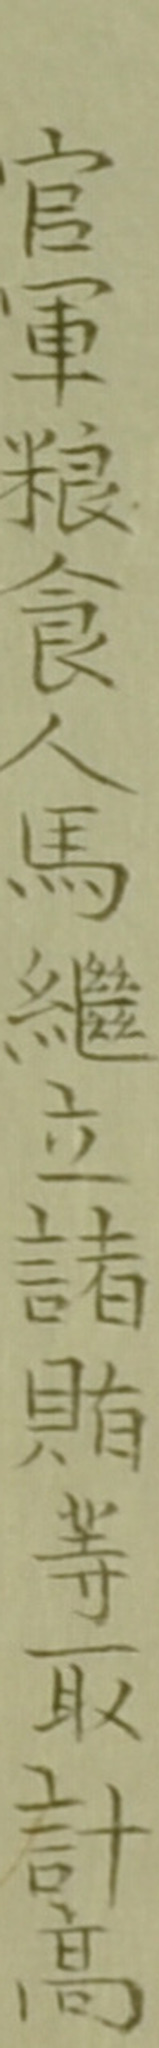官軍糧食人馬継立諸賄等取計高
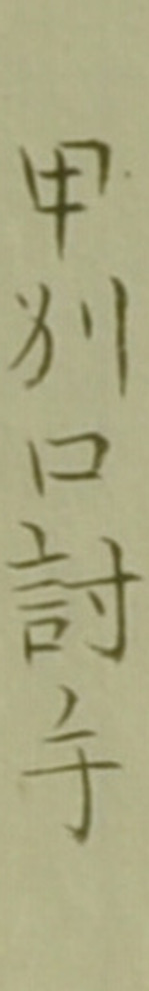甲州口討手
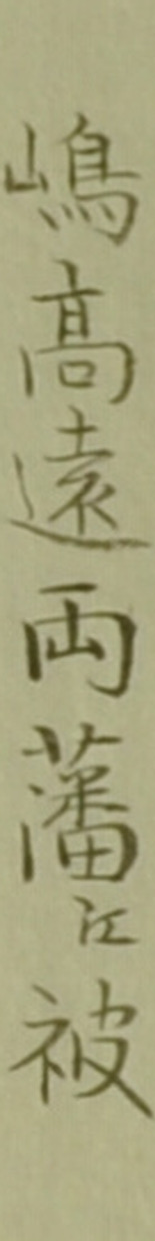嶋藩高遠両藩江被
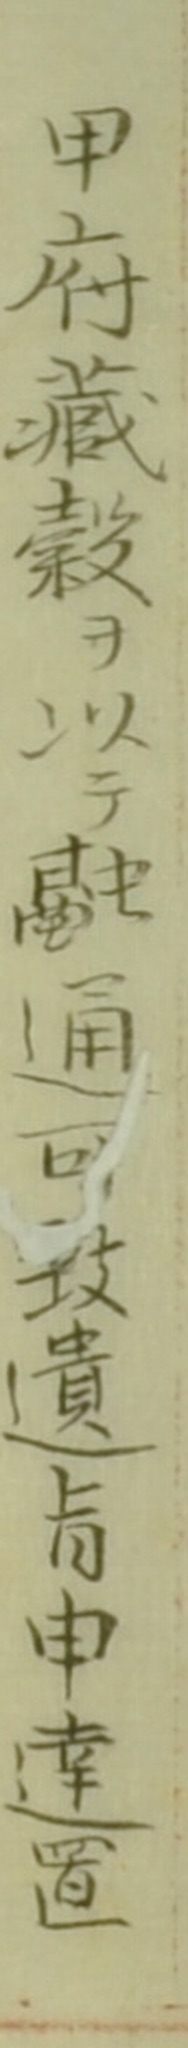甲府蔵穀ヲ以テ融通可致遣旨申達置
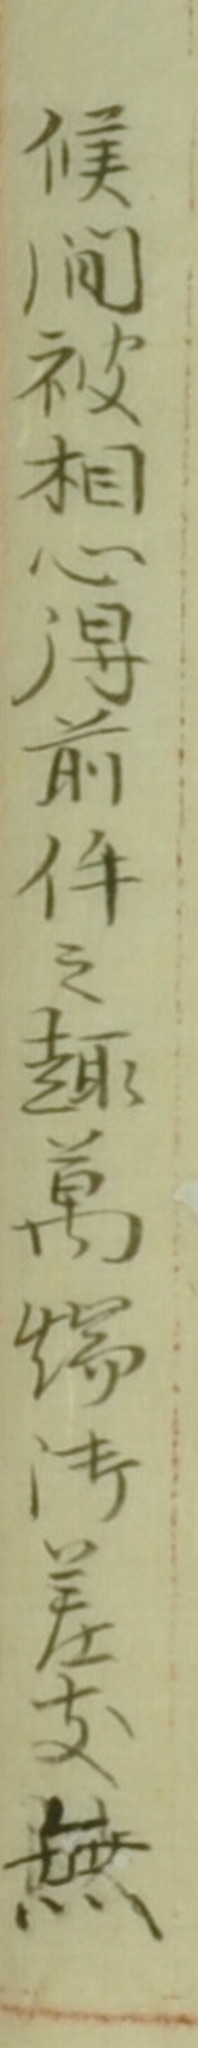候間被相心得前件之趣萬端御差支無
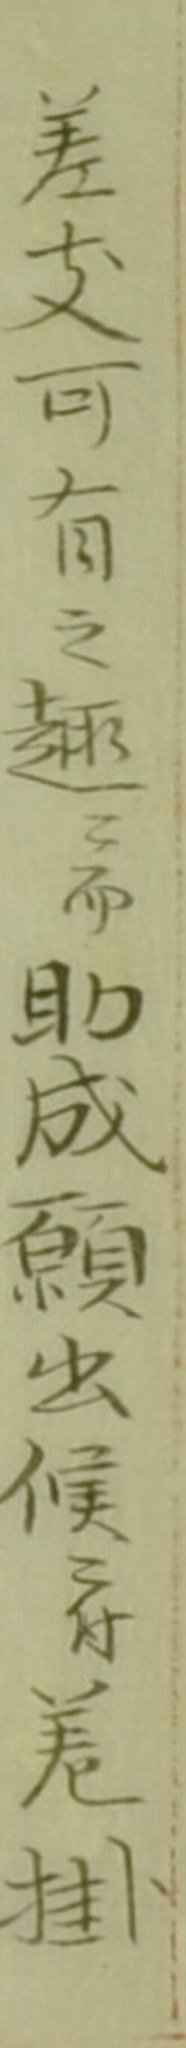差支可有之趣ニ而助成願出候ニ付差掛
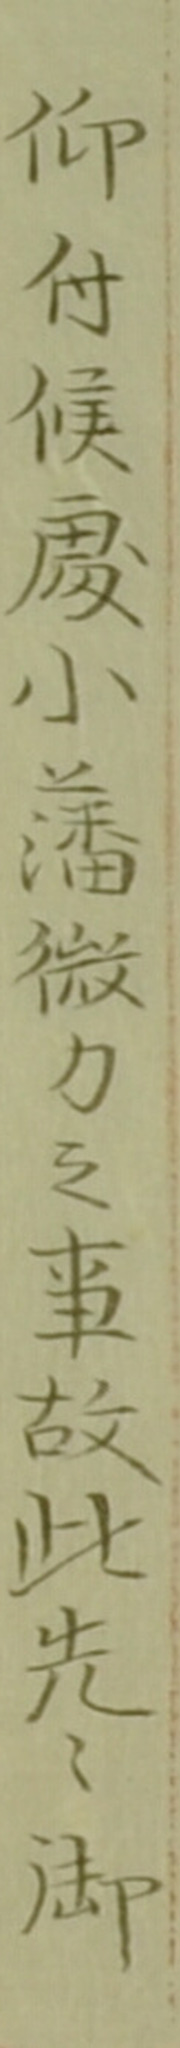仰付候処小藩微力之事故此先々御
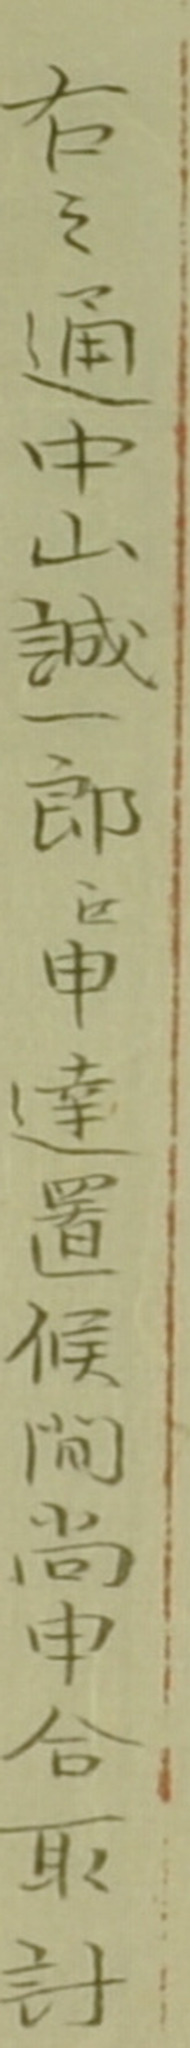右之通中山誠一郎江申達置候間尚申合取計
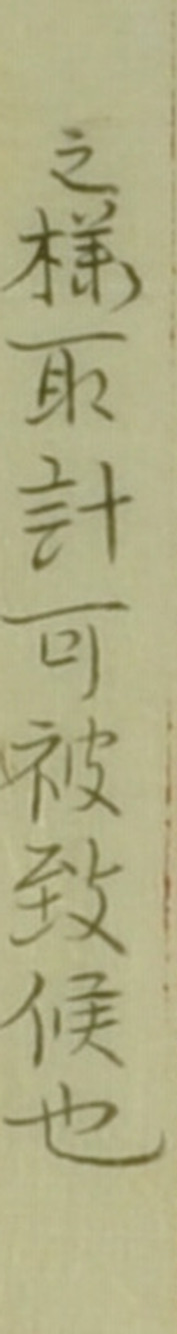之様取計可被致候也
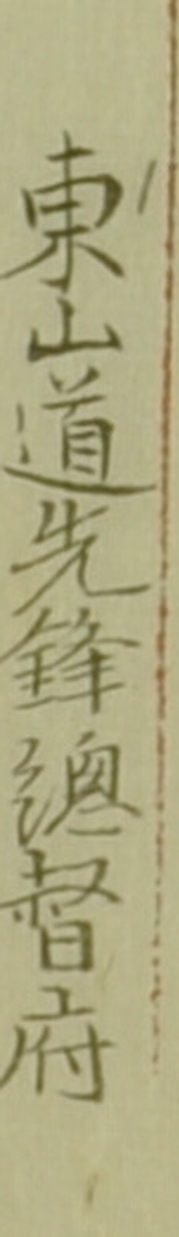東山道先鋒総督府

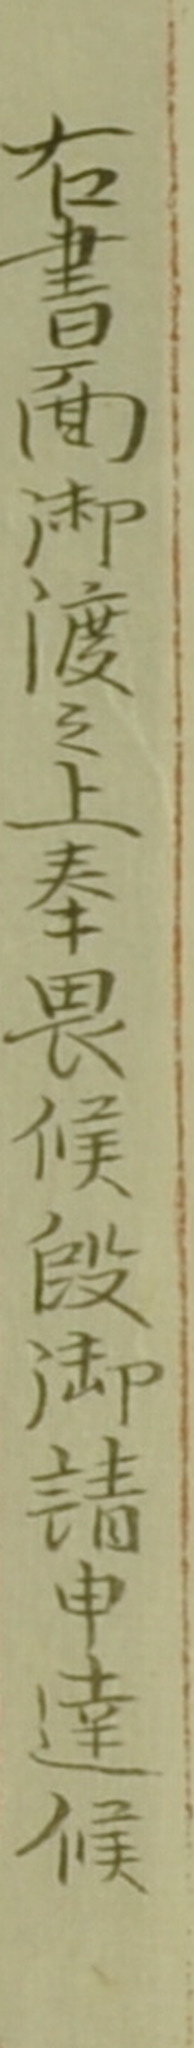右書面御渡之上奉畏候段御請申達候
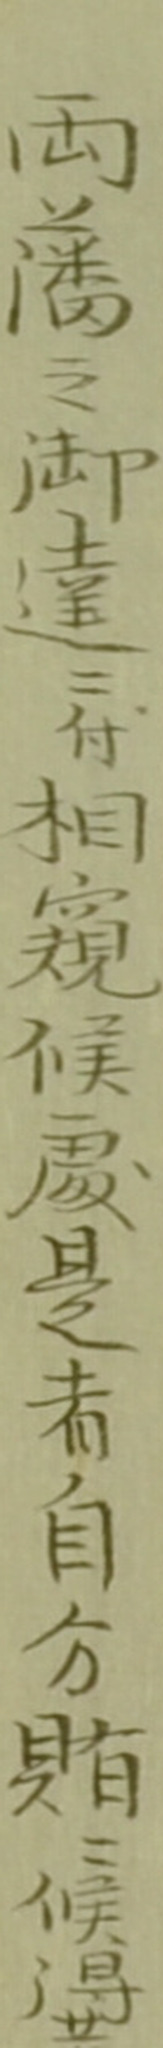両藩之御達ニ付相窺候処是者自分賄ニ候得共
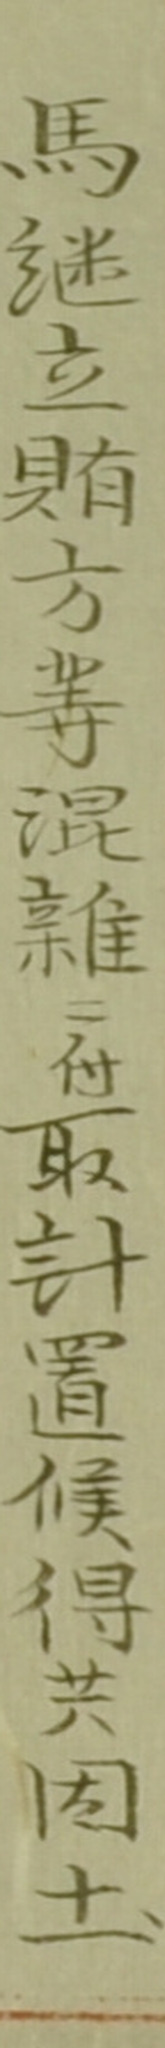馬継立賄方等混雑ニ付取計置候得共因土
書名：御東征ニ付甲州口兵食人馬御賄之事件（控）
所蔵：伊那市立高遠町図書館・合同会社AMANE
